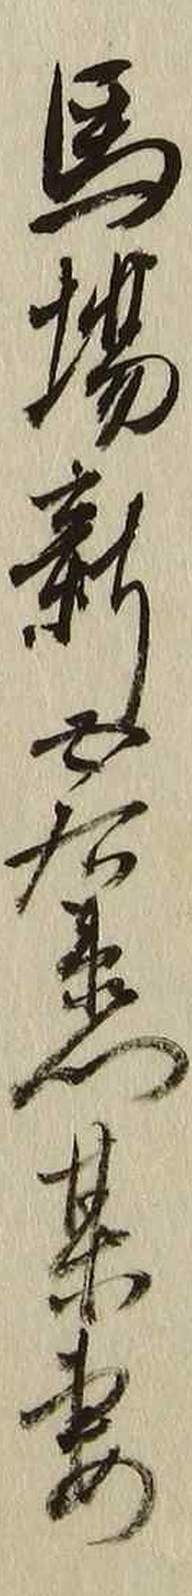女馬場新五右衛門某妻
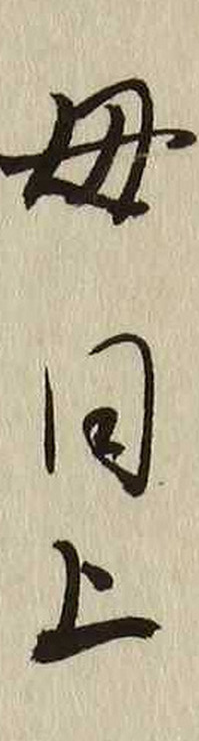母同上
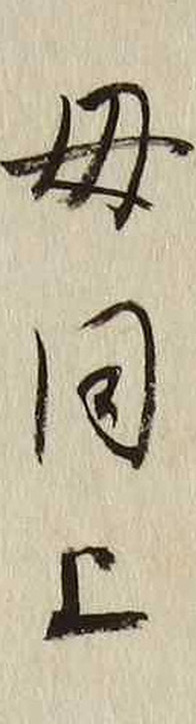母同上
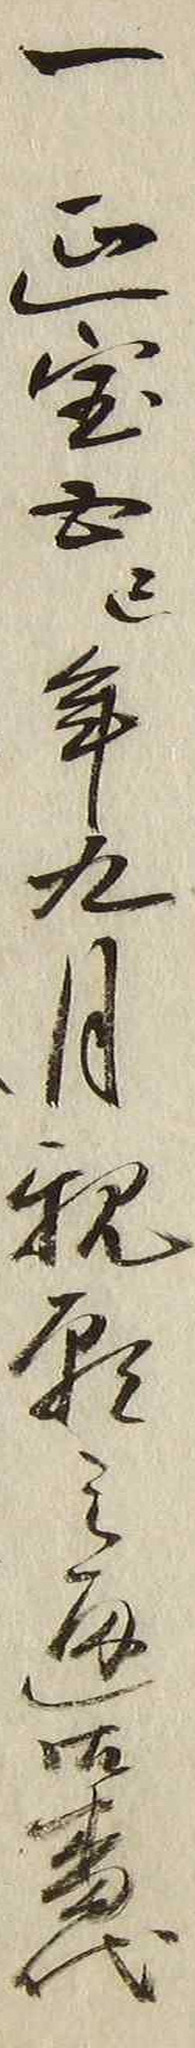一延宝五巳年九月親願之通御番代
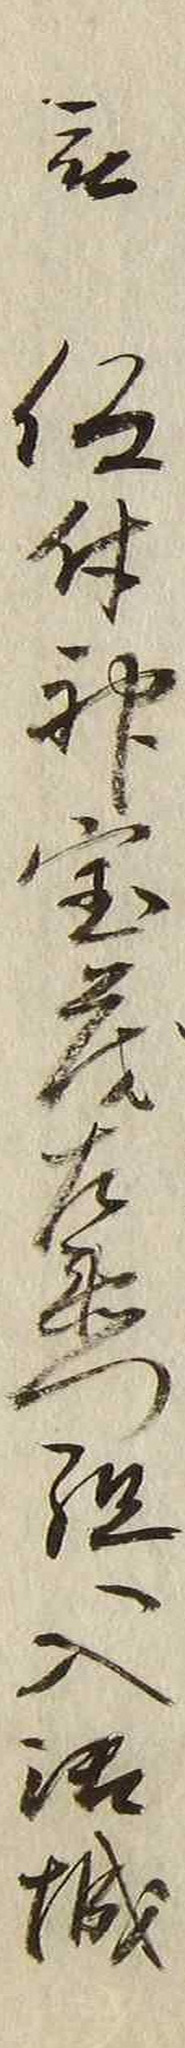被仰付神宝茂左衛門組へ入御城

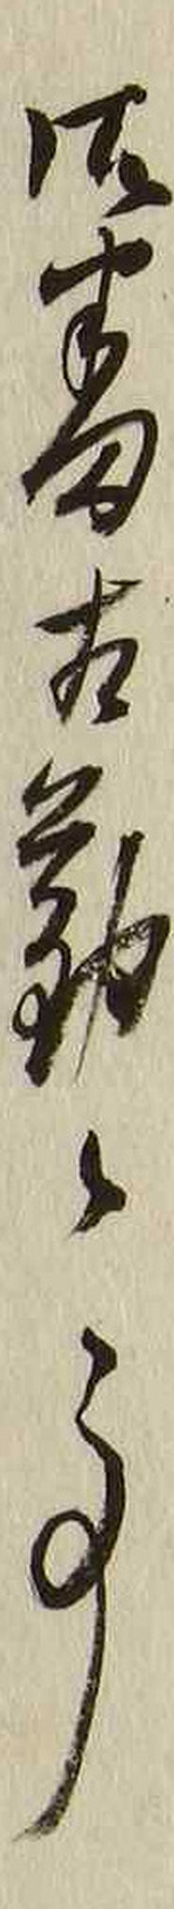御番相勤候事
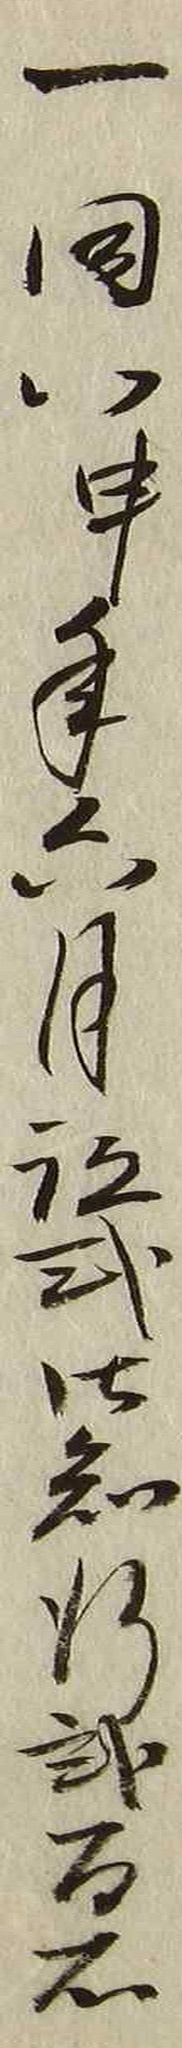一同八申年六月跡式御知行弐百石
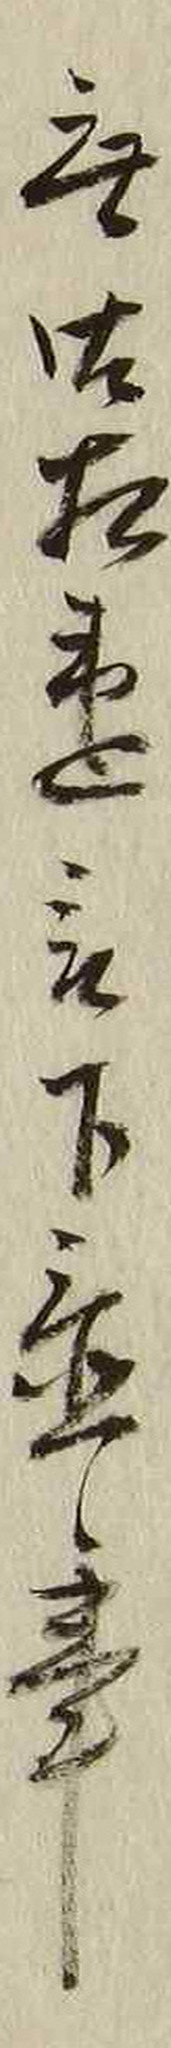無御相違被下置候事
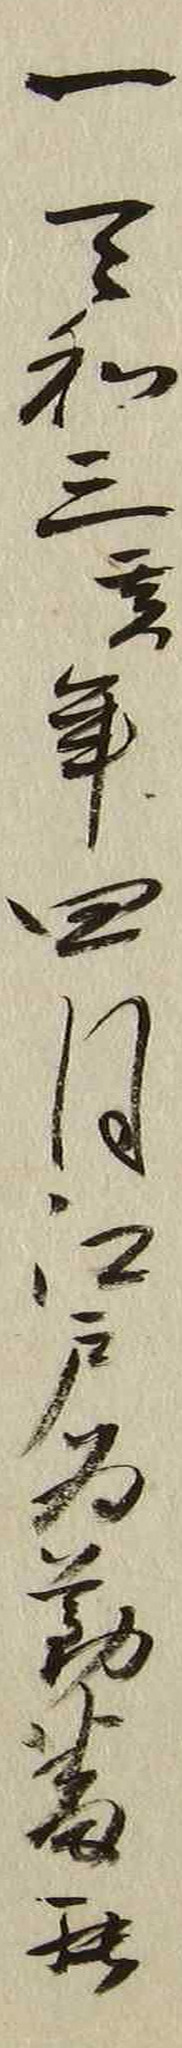一天和三亥年四月江戸為勤番罷
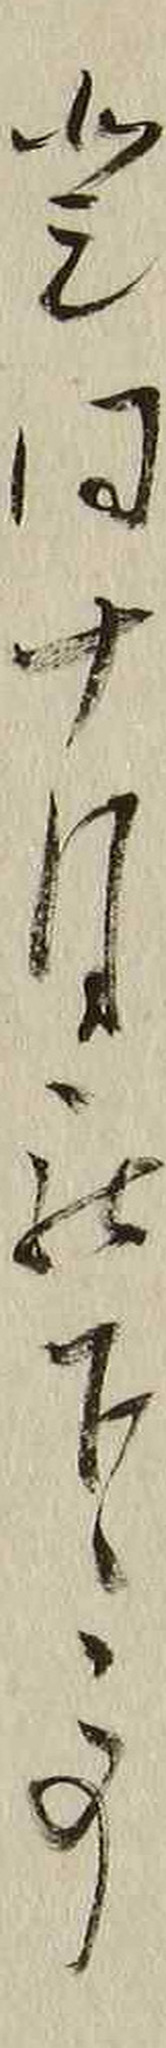登同十月罷下候事
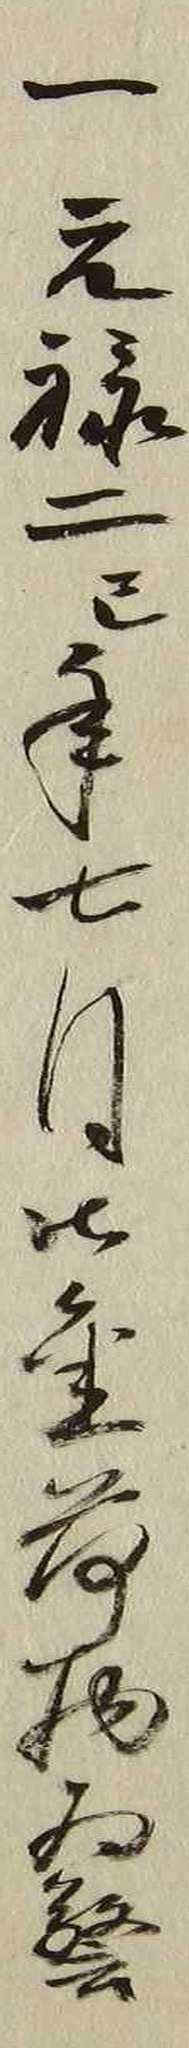一元禄二巳年七月御金荷物為警
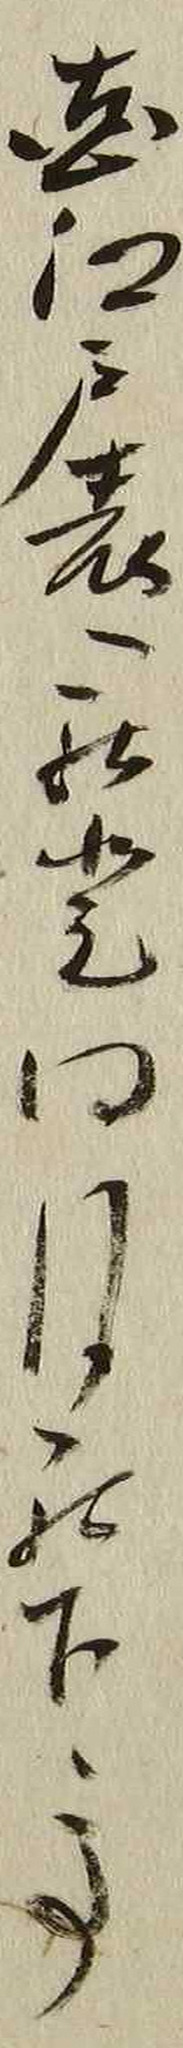固江戸表へ罷登同月罷下候事
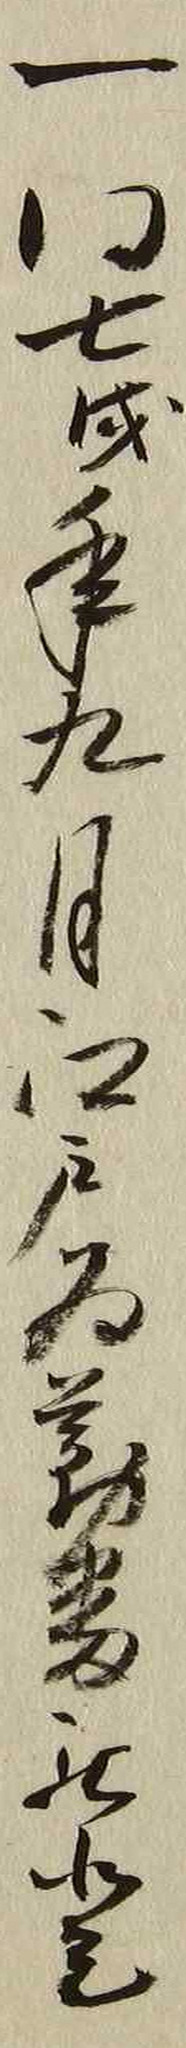一同七戌年九月江戸為勤番罷登
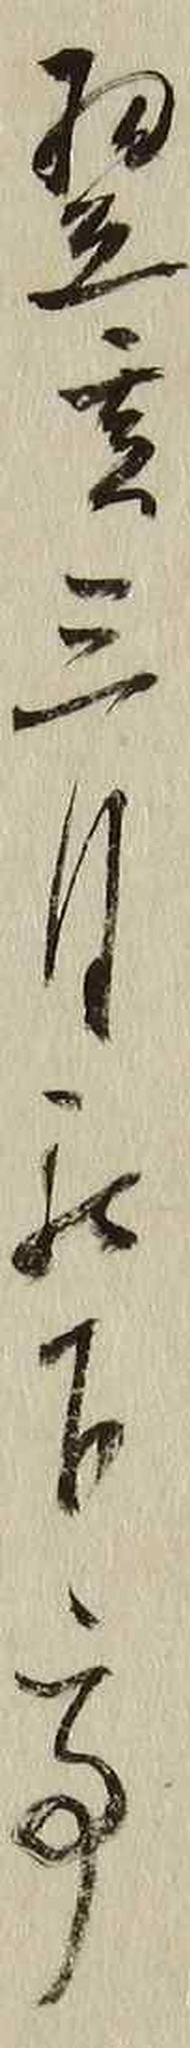翌亥三月罷下候事
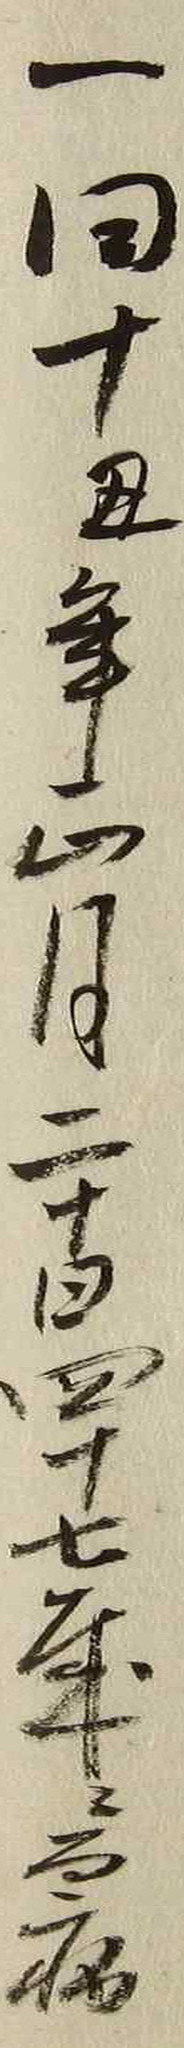一同十丑年正月二十日四十七歳ニ而病
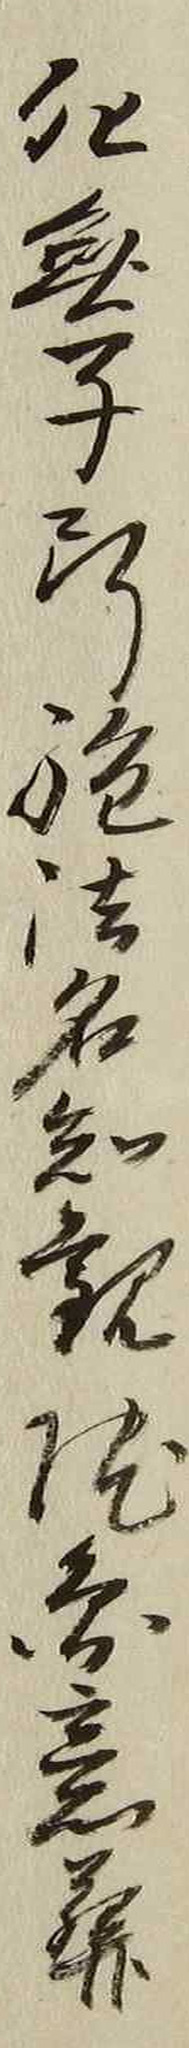死無子断絶法名知観院円意葬
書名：諸士系譜　巻之352　す之部2
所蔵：会津若松市立会津図書館
